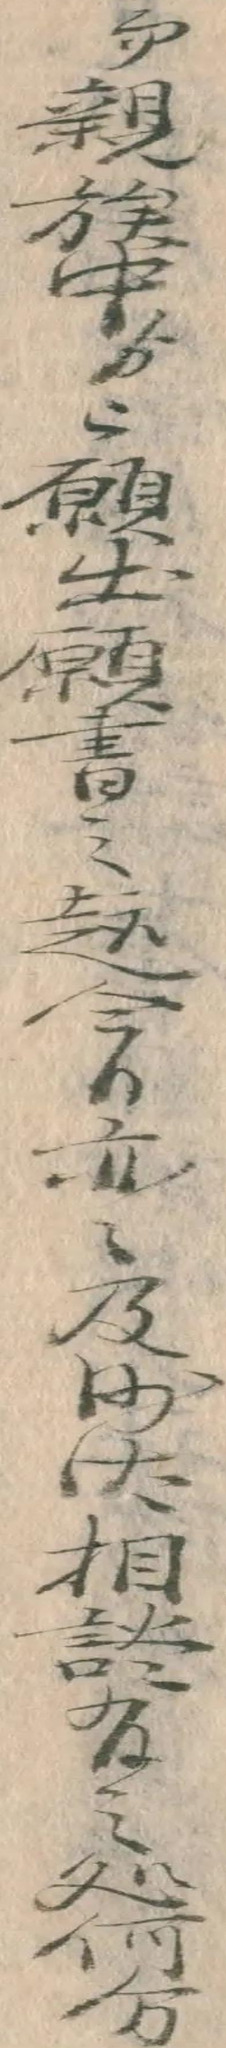而親族中ゟ被願出願書之趣今日亦〻及沙汰相談有之処何分
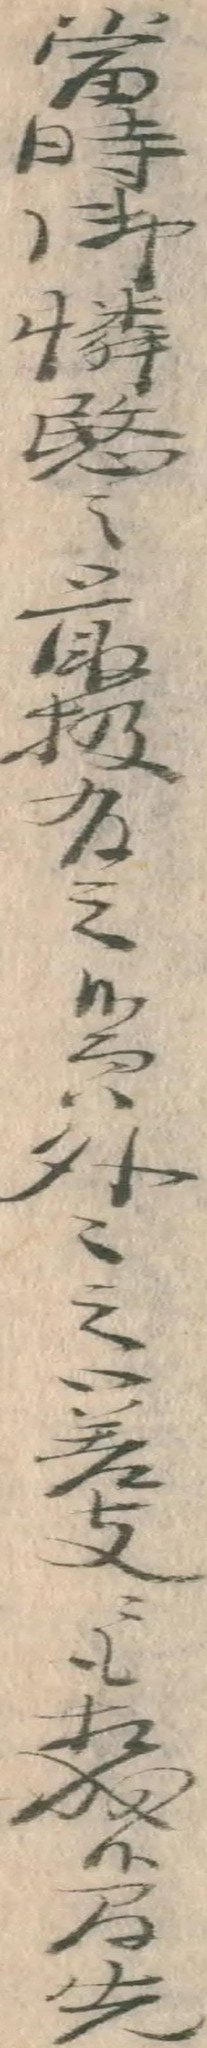當時御憐愍之御取扱有之候而ハ外々之御差支ニも相成候間先
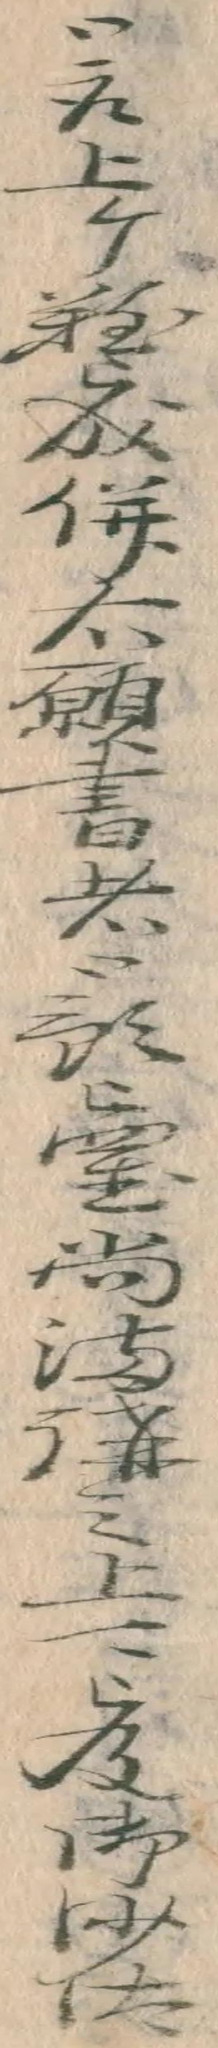御取上ケ難被成併右願書者御預被置尚満講之上可被及御沙汰
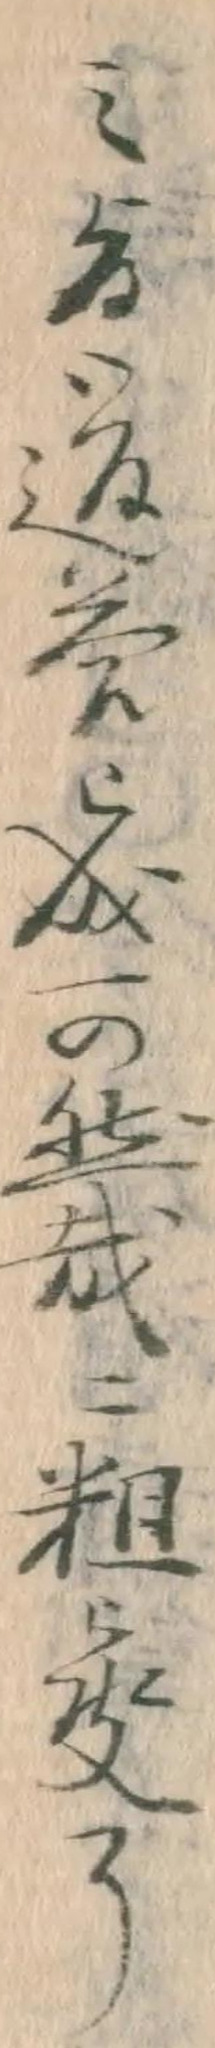之旨御返答被成可然哉ニ粗被決了
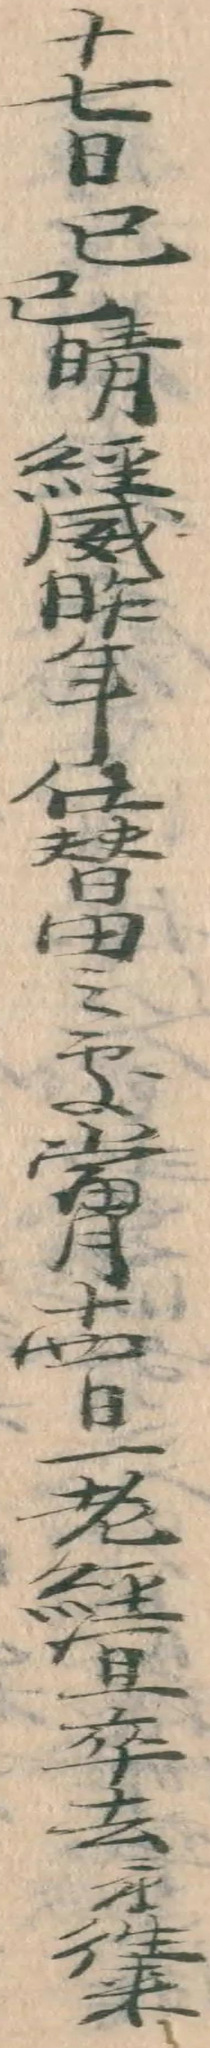十七日己巳晴経威昨年仕替由之處當月十四日一老経宜卒去ニ付往来
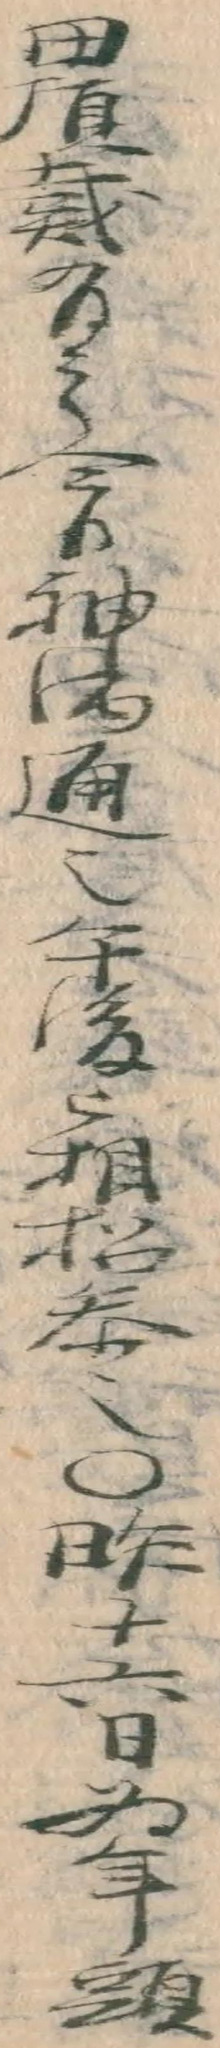田植戴有之今日神満通也午後被相招参也〇昨十六日為年頭
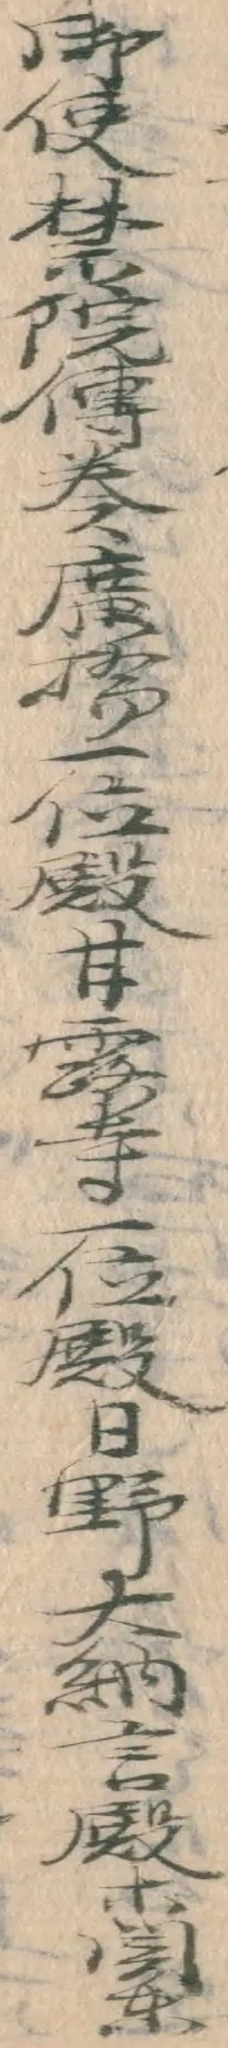御使禁院傳奏広橋一位殿甘露寺一位殿日野大納言殿等関東
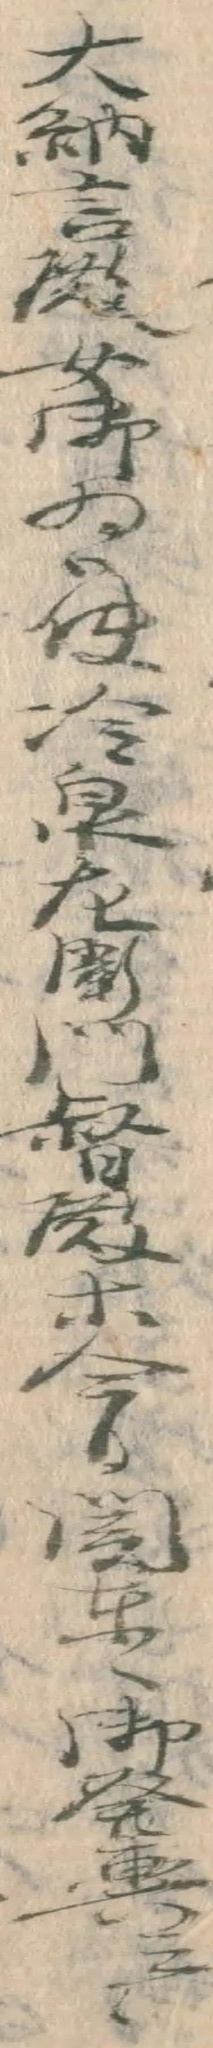大納言殿女御為御使冷泉左衛門督殿等今日関東へ御発輿云々
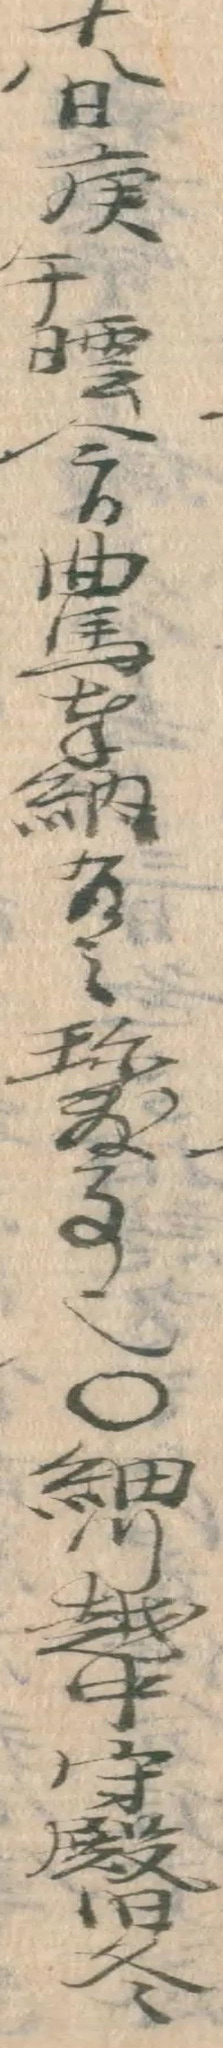十八日庚午曇今日曲馬奉納有之珍敷事也○細川越中守殿旧冬
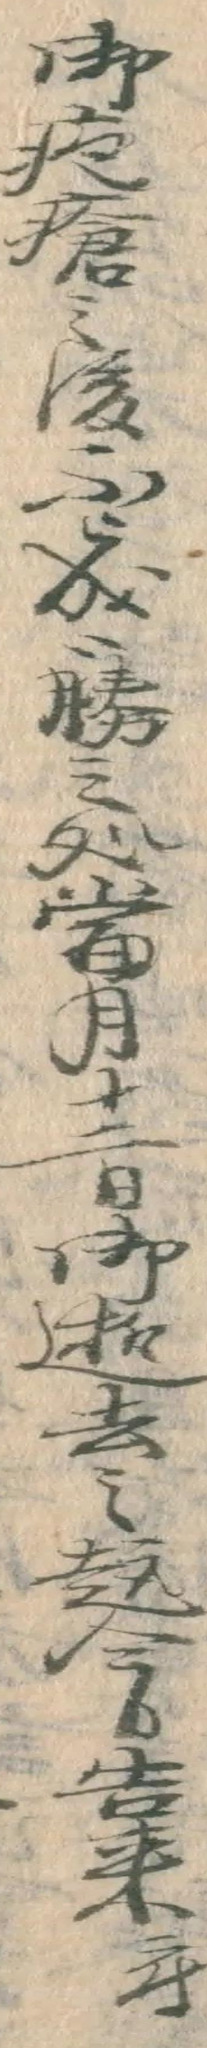御疱瘡之後不被成御勝之処當月十二日御逝去之趣今日告来ニ付
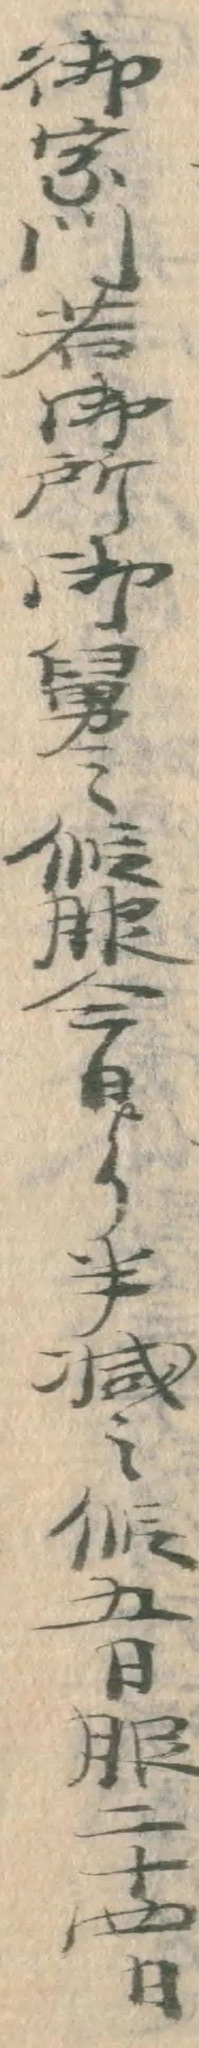御家門若御所御舅之仮服今日より半減之段五日服二十四日
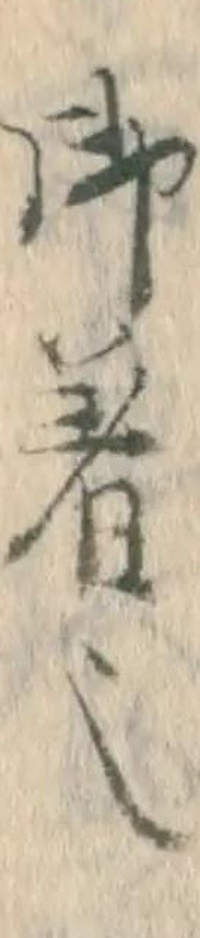御着也
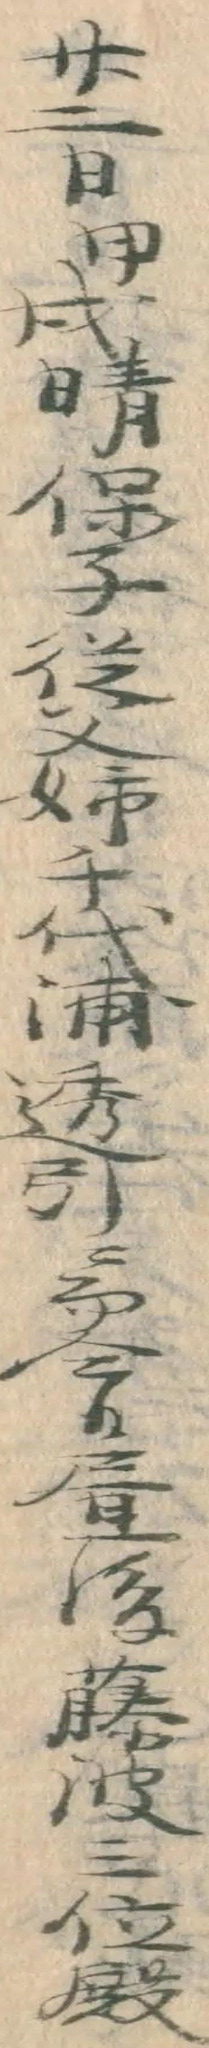廿二日甲戌晴保子従父姉千代浦透引ニ而今日昼後藤波三位殿
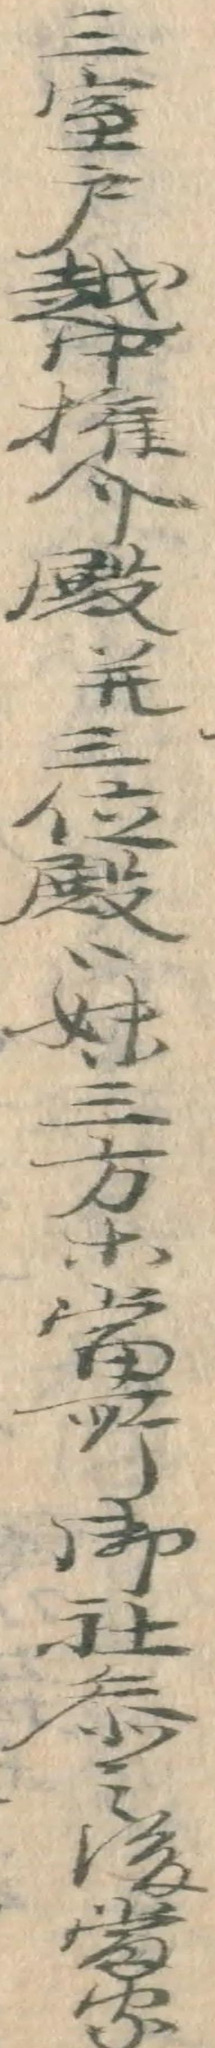三室戸越中権介殿并三位殿御妹三方等當所御社参之後當家
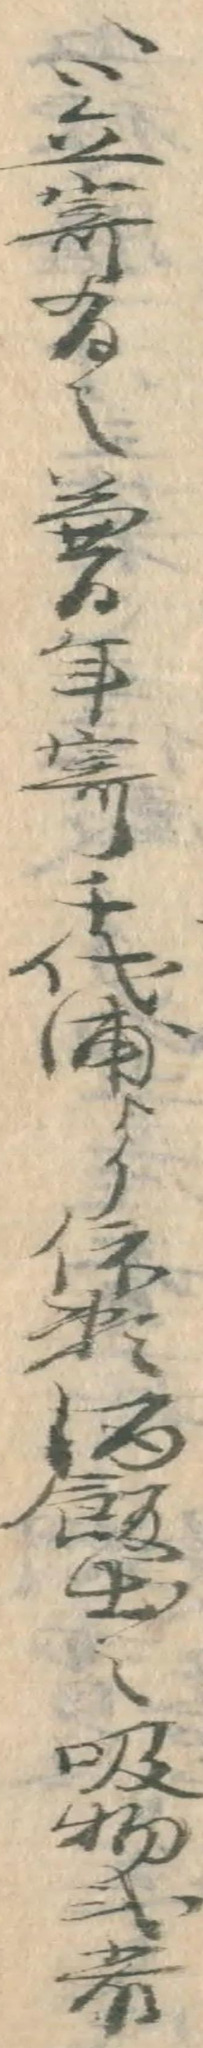へ御立寄有之兼而年寄千代浦より依頼酒飯出也吸物弐肴

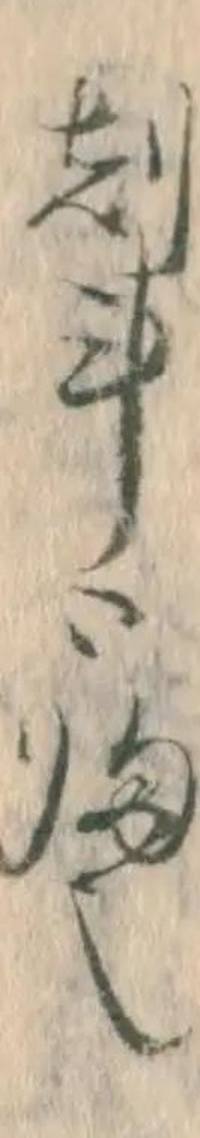刻斗御帰也
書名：賀茂社記録. 第65冊
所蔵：国立国会図書館 National Diet Library, JAPAN
